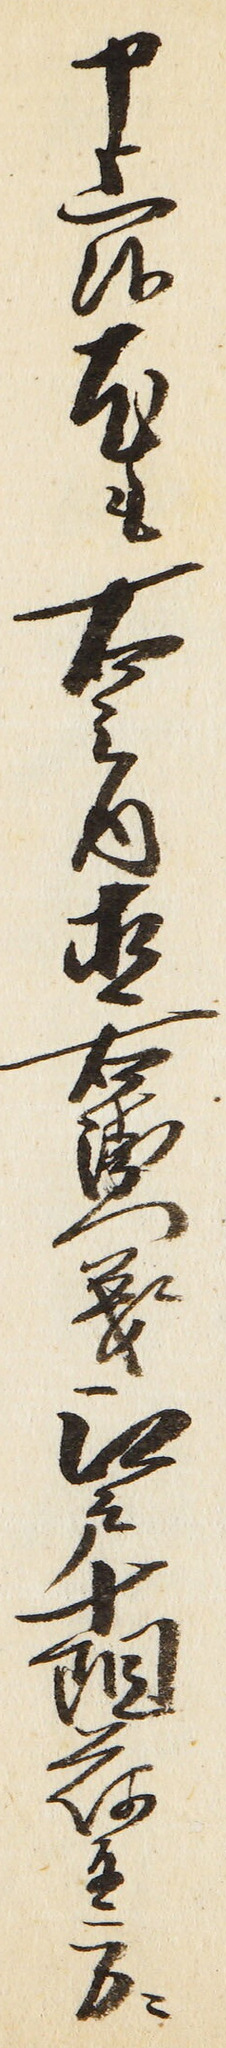申上候尤も右之内直右衛門義江戸十組荷主方ニ
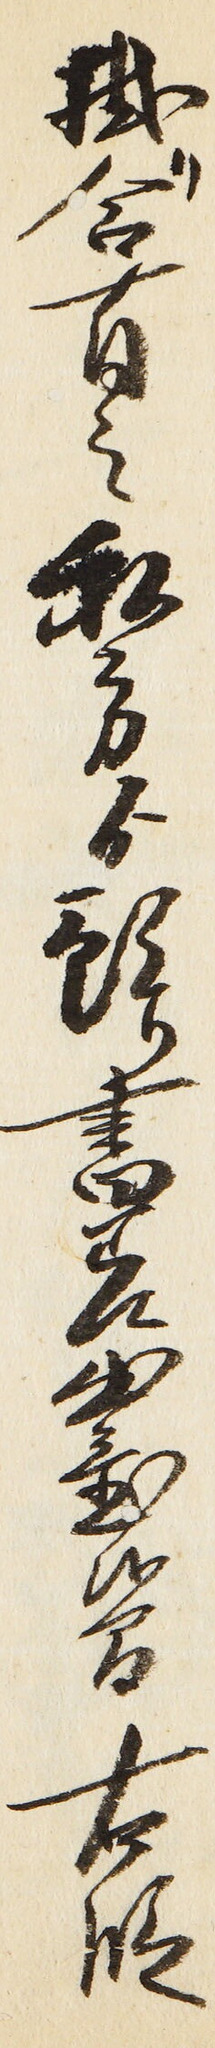掛り合有之私方ゟ預り書差出置候間右段
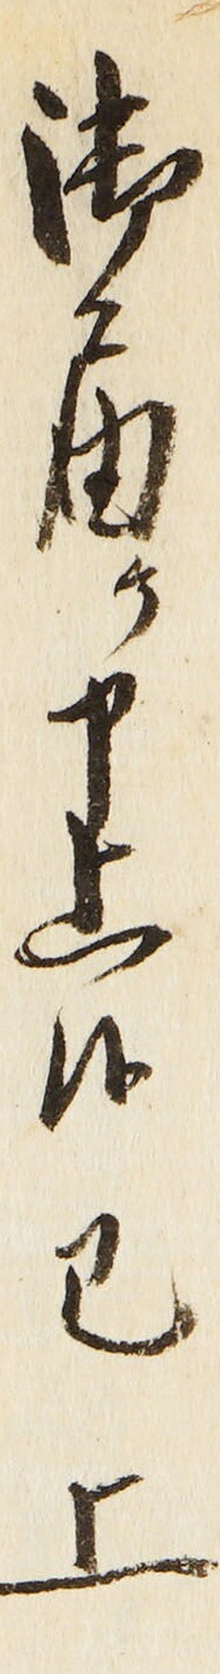御届ケ申上候已上
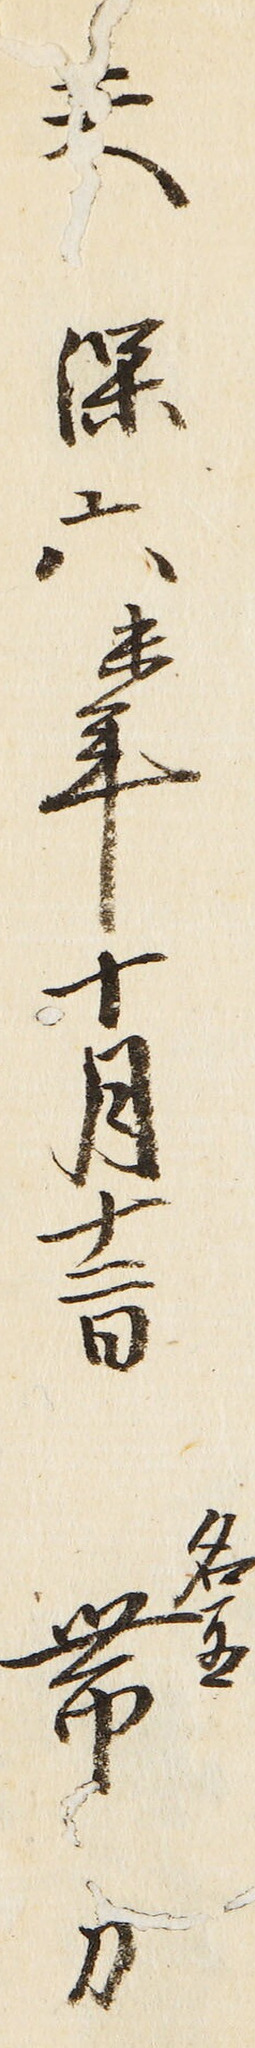天保六未年十月十二日右村
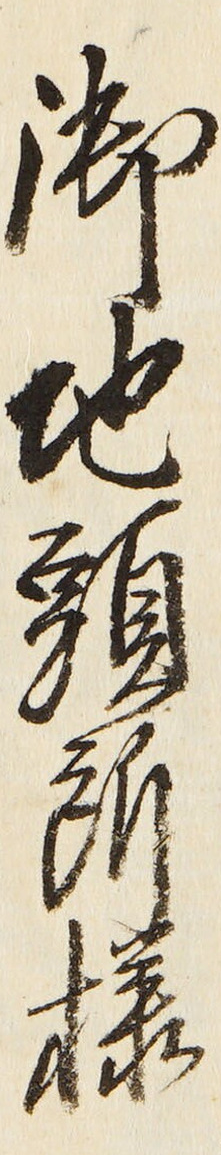御地頭所様
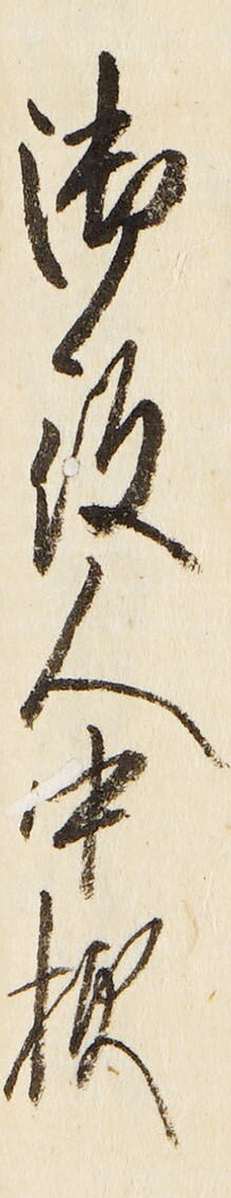御役人中様
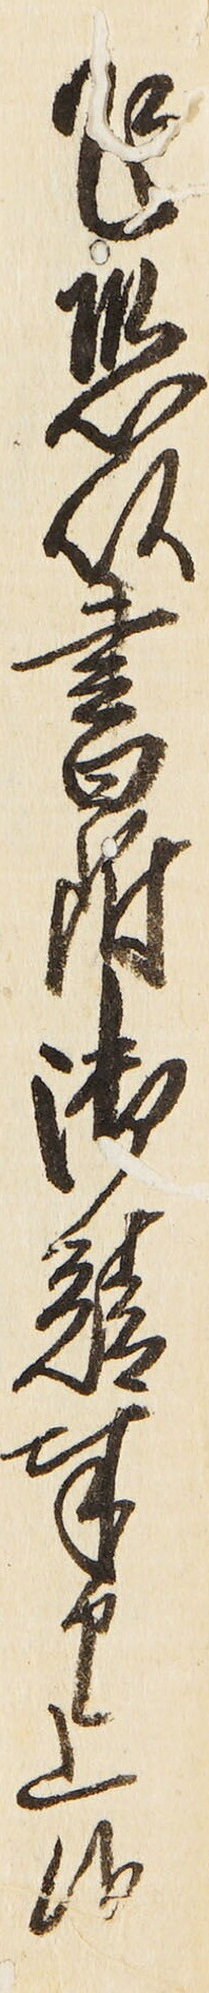乍恐以書付御請奉申上候
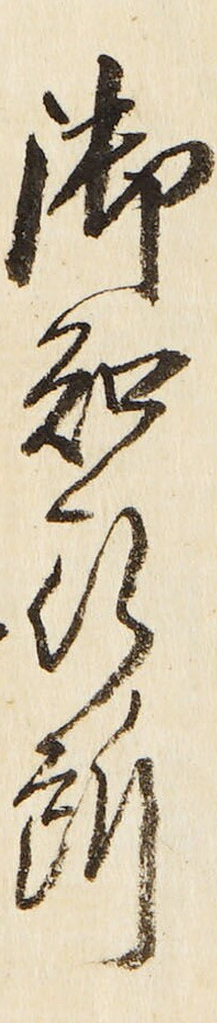御知行所
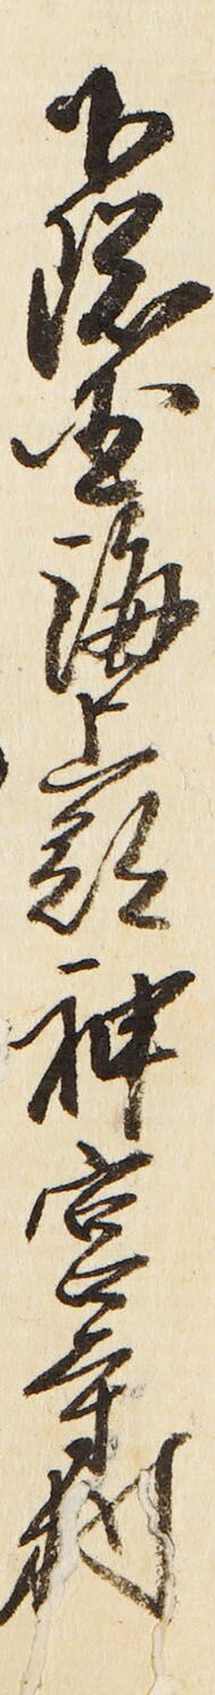下総国海上郡神宮寺村
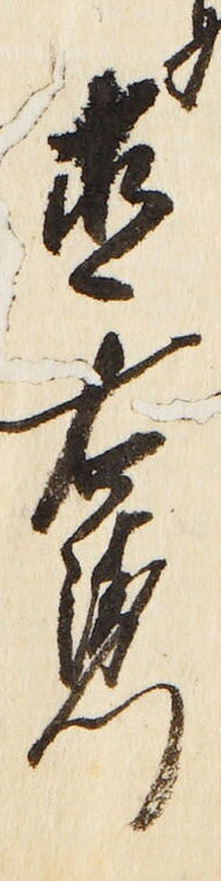直右衛門
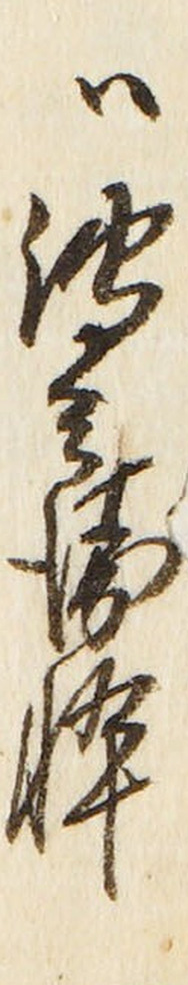同伝兵衛忰
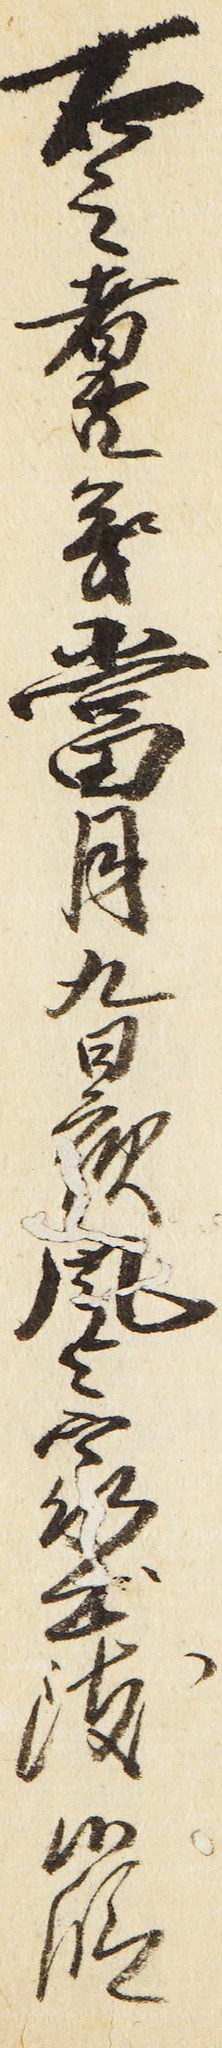右之者共義当月九日夜風与家出致候段

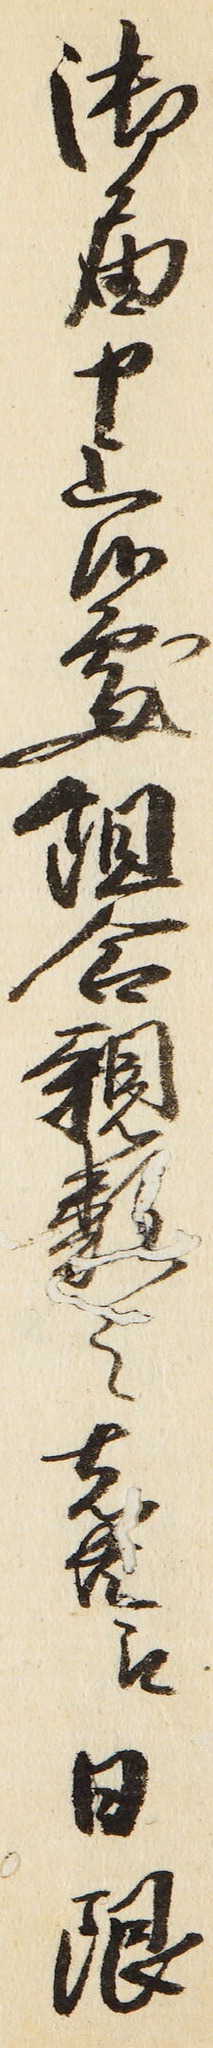御届申上候処組合親類之者共江日限
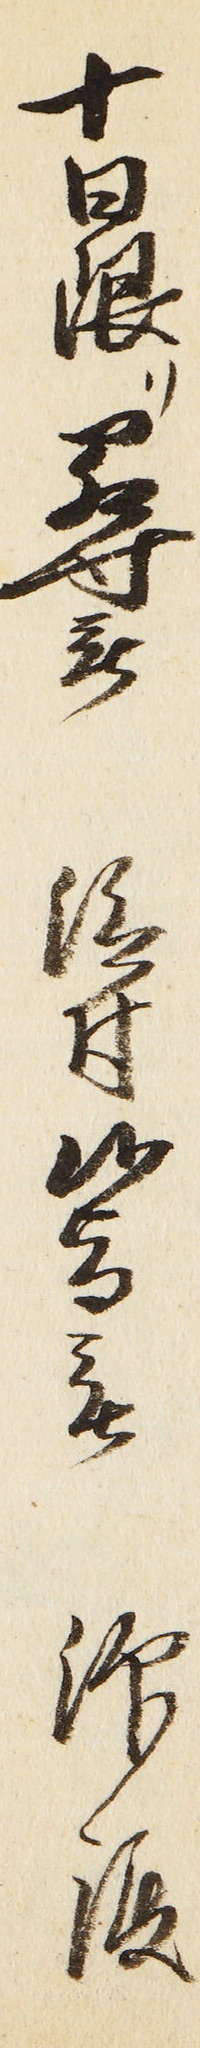十日限り尋被仰付候旨被仰渡
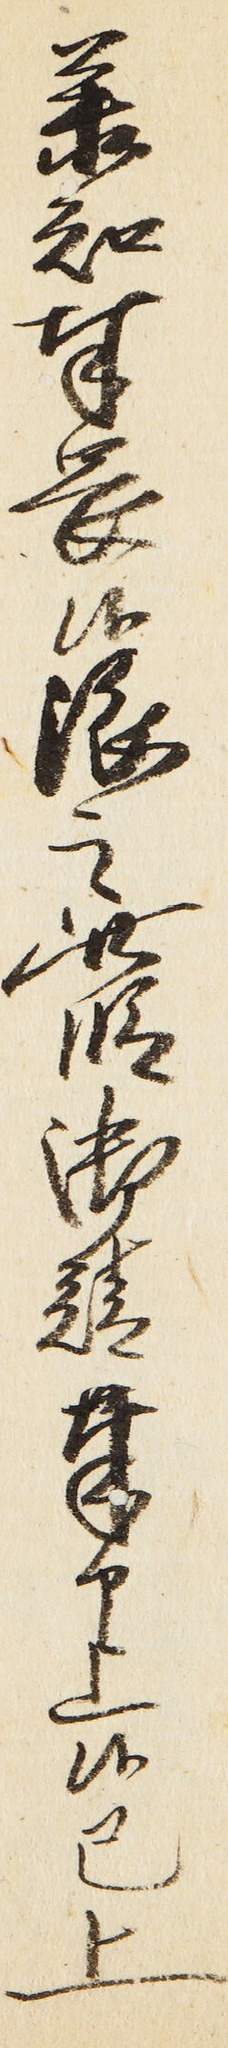承知奉畏候依之此段御請奉申上候已上
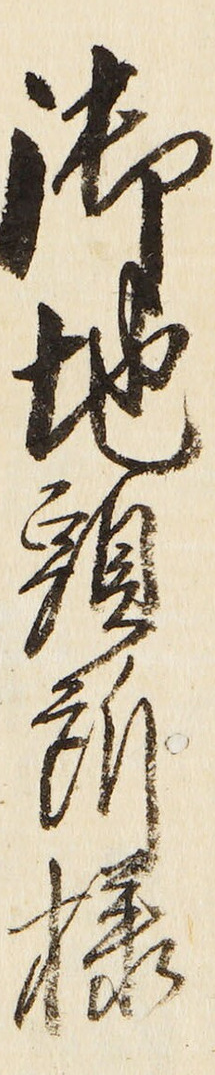御地頭所様
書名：難船一件記録
